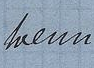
schlimmsten
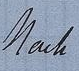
sind
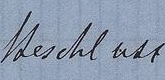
hinter uns,
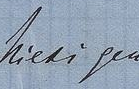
wenn ich
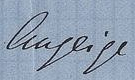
auch noch
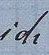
mache.
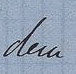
Nach
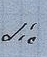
der
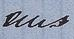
Beschluss
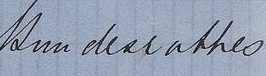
Bundesrathes
